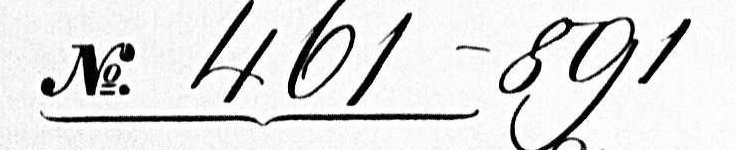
No. 461 – 1891
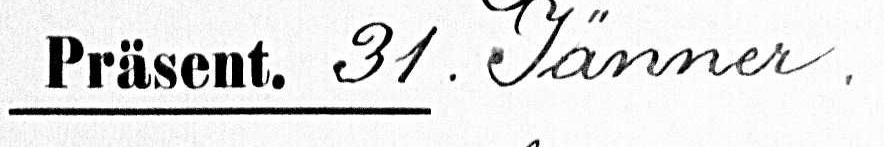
Präsent. 31. Jänner
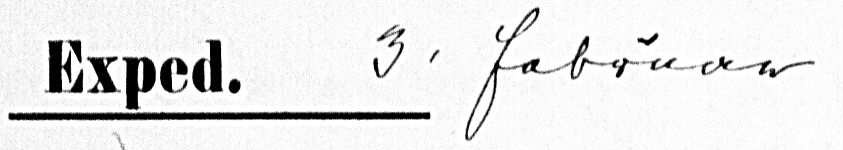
Expedit 3. Februar
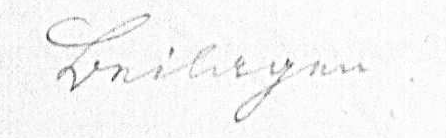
Beilagen
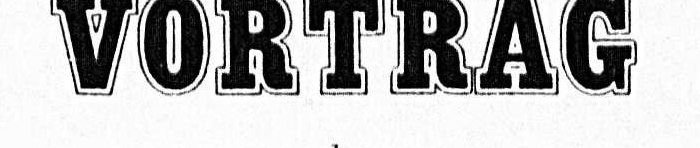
VORTRAG
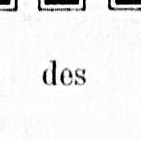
des
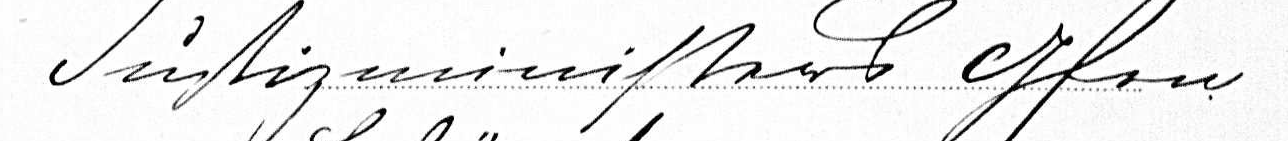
Justizministers Gfen
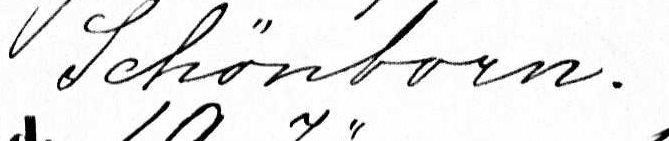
Schönborn
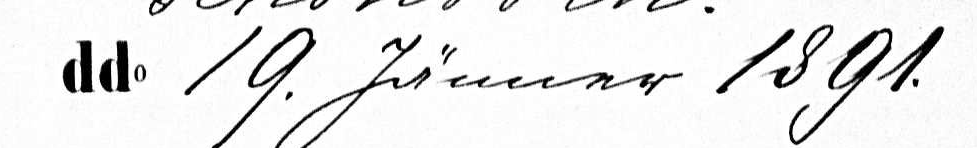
Ddo 19 Jänner 1891
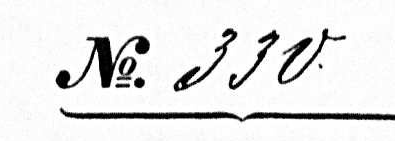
No 330
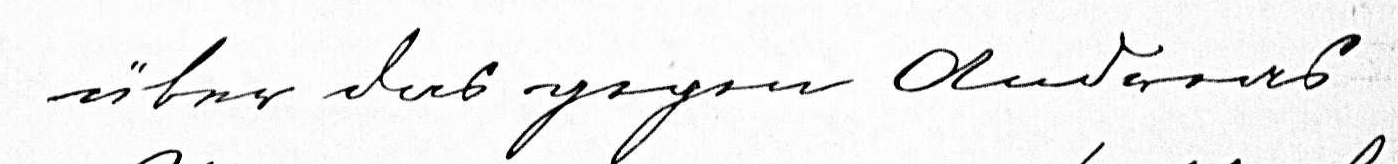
Über das gegen Andreas
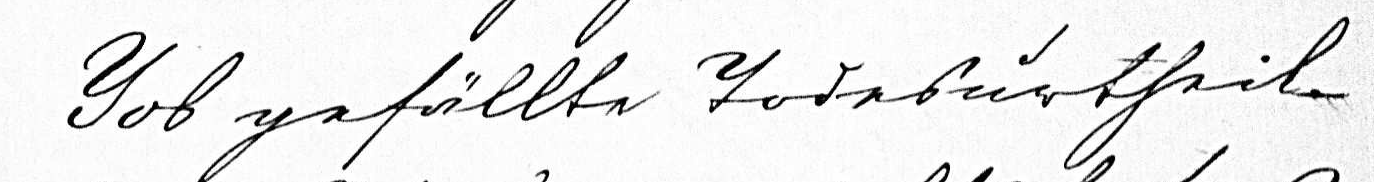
Job gefällte Todesurtheil
